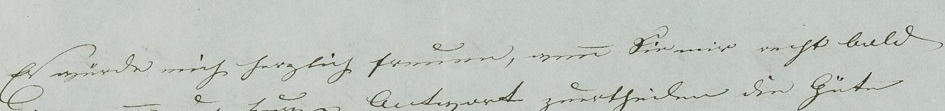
Es würde mich herzlich freuen, wenn Sie mir recht bald
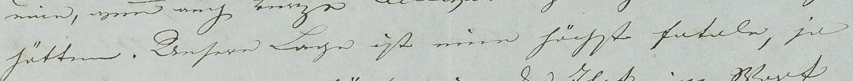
hätten. Unsere Lage ist eine höchst fatale, ja
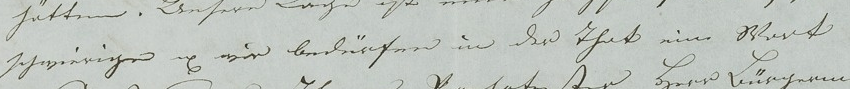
schwierige & wir bedürfen in der That ein Wort
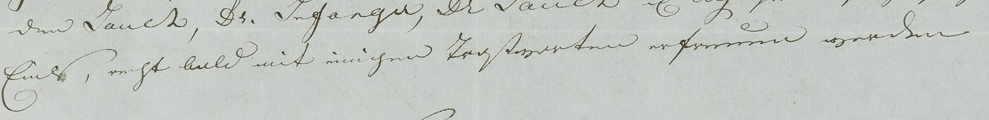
Eins, recht bald mit einigen Trostworten erfreuen werden
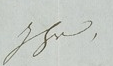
Ihr,
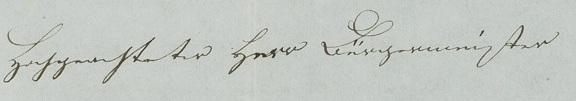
Hochgeachteter Herr Bürgermeister
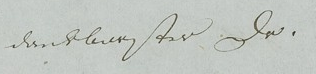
dankbarster Dr.
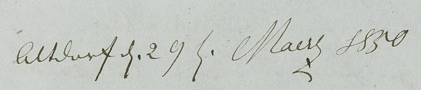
Altdorf d. 29t. Maerz 1850
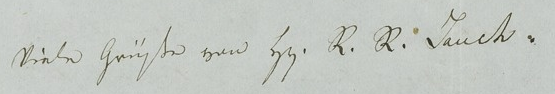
Viele Grüße von Hr. R.R. Jauch.
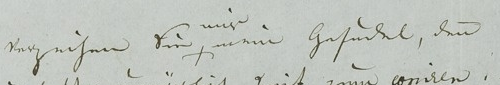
Verzeihen Sie mir mein Gesudel, denn
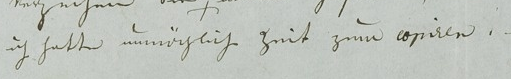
ich hatte unmöglich Zeit zum copiren. –
